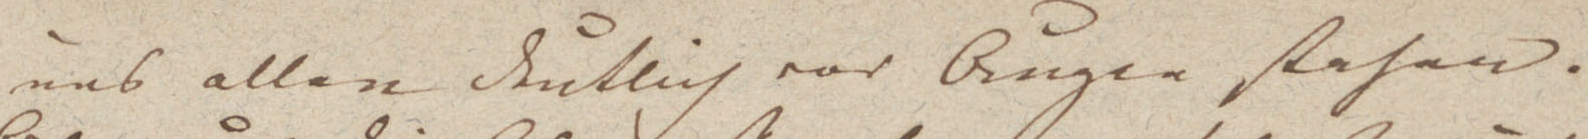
uns allen deutlich vor Augen stehen.
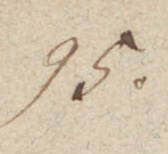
95.
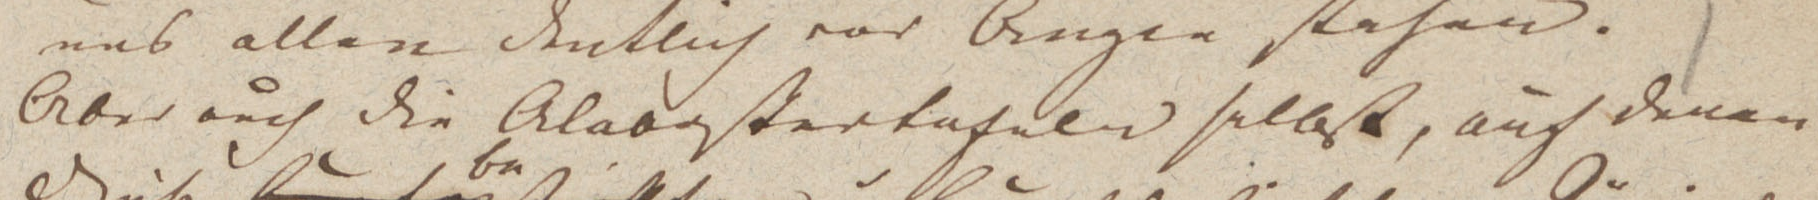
Aber auch die Alabastertafeln selbst, auf denen
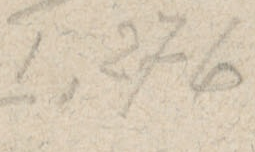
1, 276
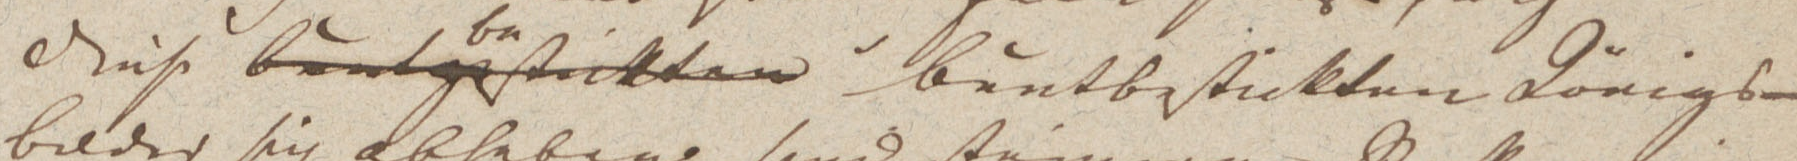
diese buntgebestickten buntbestickten Königs-
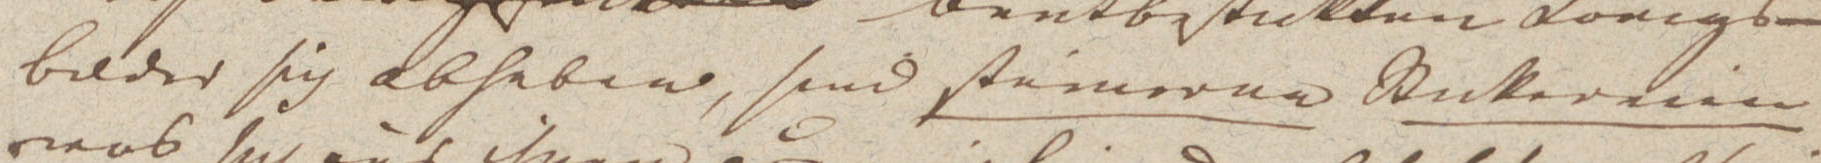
bilder sich abheben, sind steinerne Stickereien
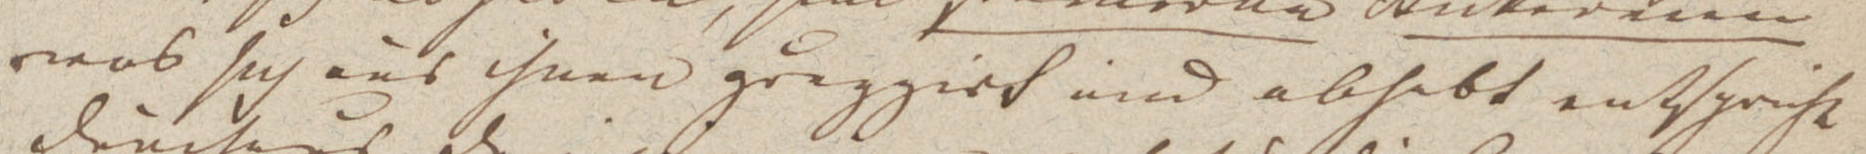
was sich aus ihnen gruppirt und abhebt entspricht
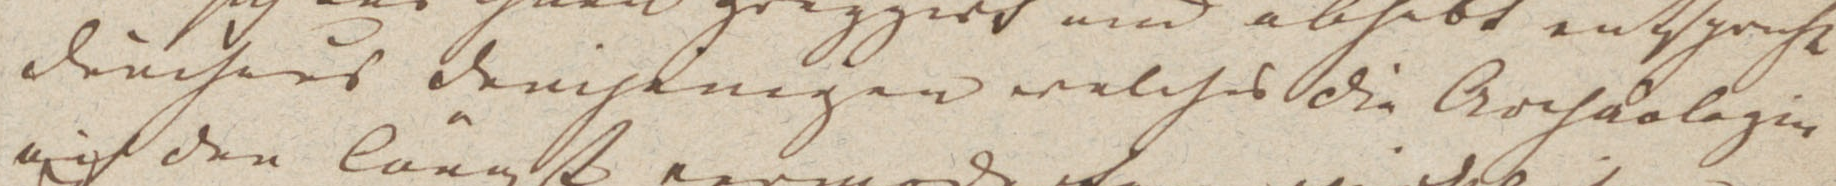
durchaus demjenigen welches die Archäologie
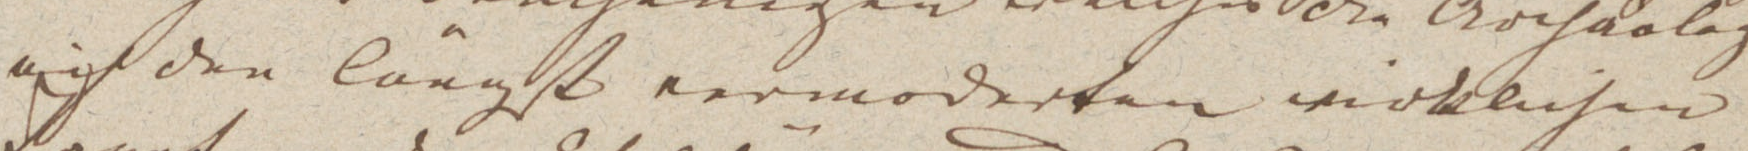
auf den längst vermoderten wirklichen
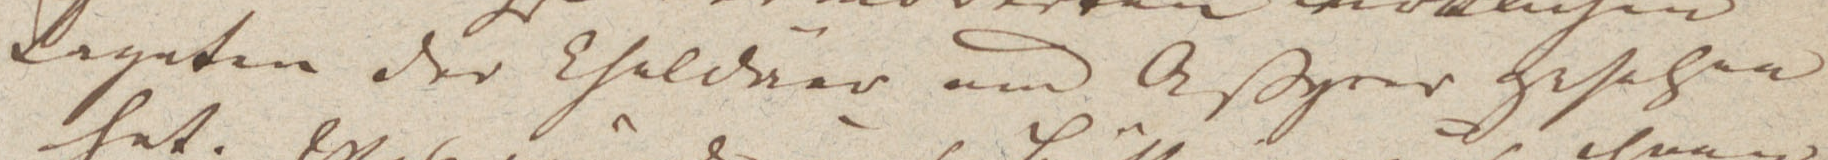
Tapeten der Chaldäer und Assyrer gesehen
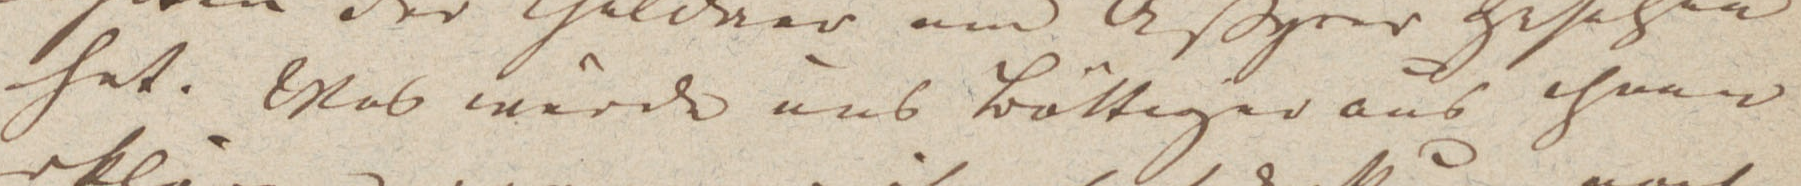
hat. Was würde uns Böttiger aus ihnen
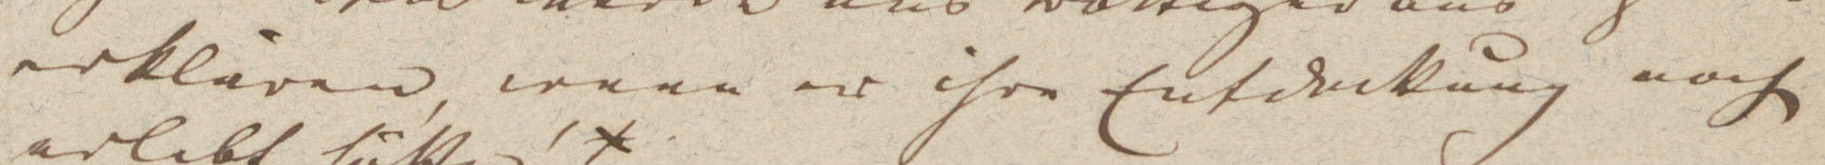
erklären, wenn er ihre Entdeckung noch
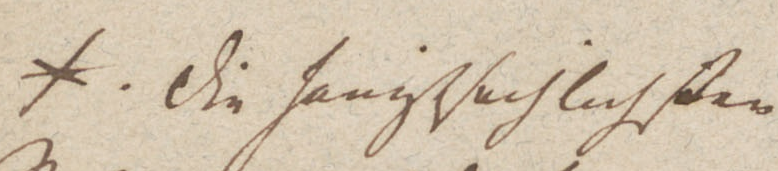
% Die hauptsächlichsten
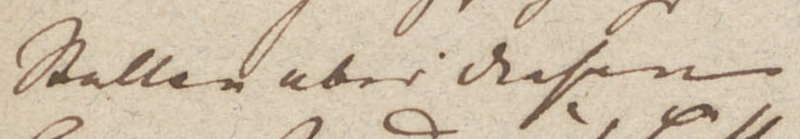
Stellen über diesen
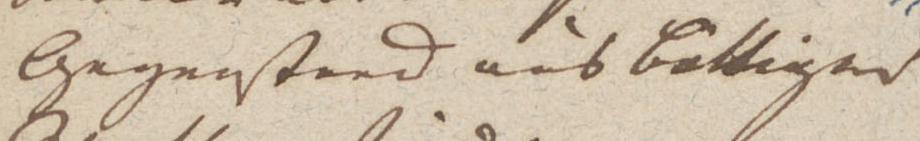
Gegenstand aus Böttigers
